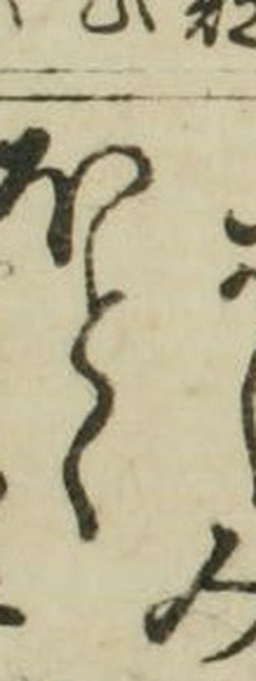ほとゝ
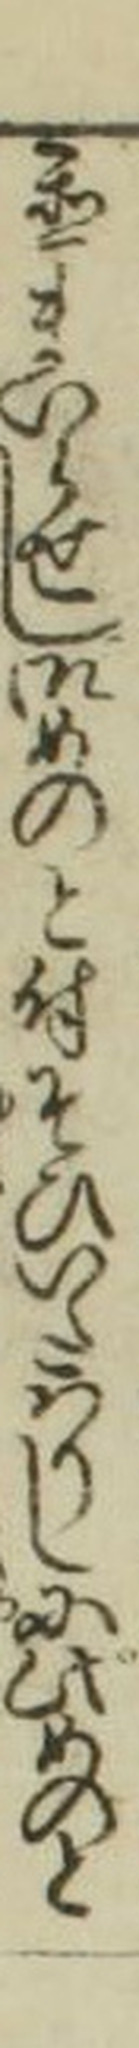置まいらせし。御めのと付そひいたはりしに。此めのと
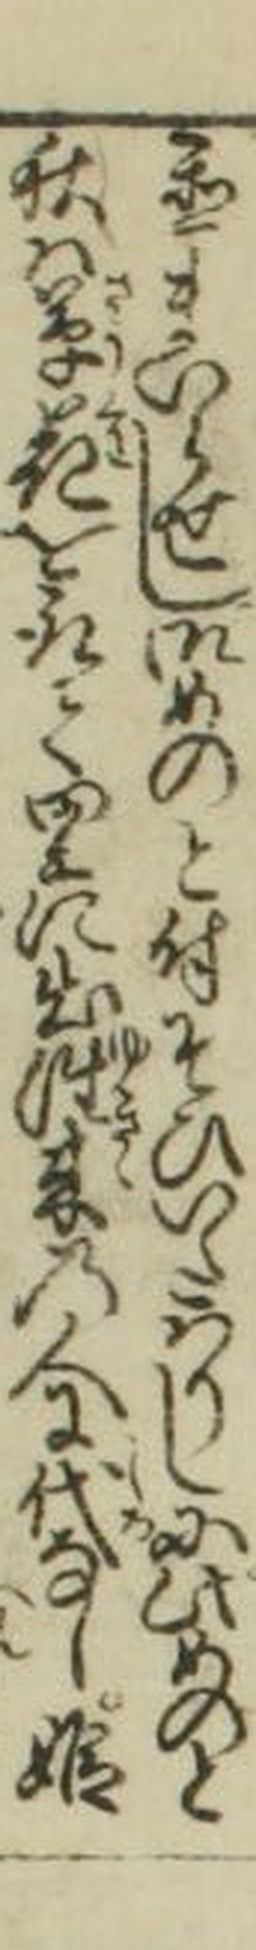秋は草花を取て里に出往来の人に代なし。姫
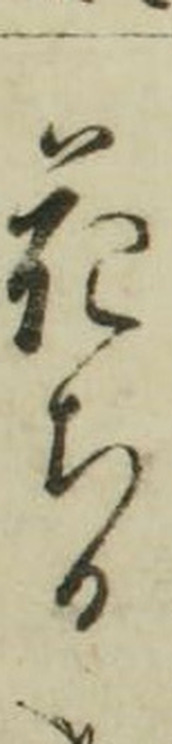花ちる
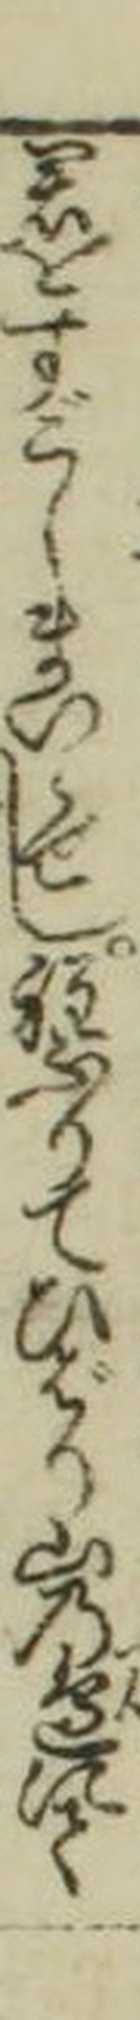君をすごしまいらせし。程ふりてひばり山の辺にて
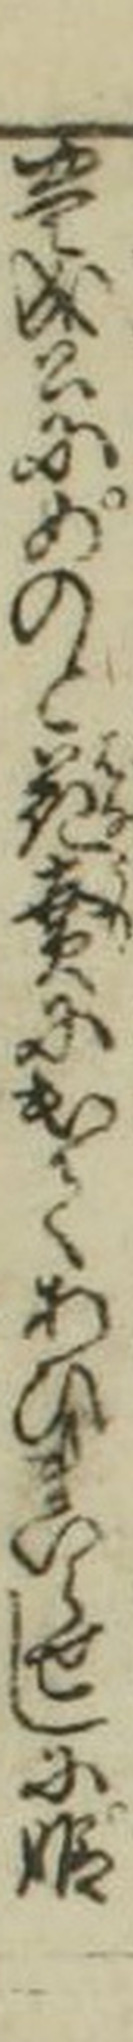豊成公に。めのと花売に出てあひまいらせしに。姫
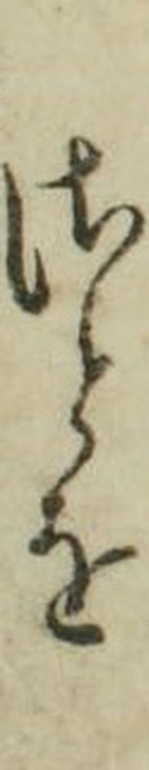さとを
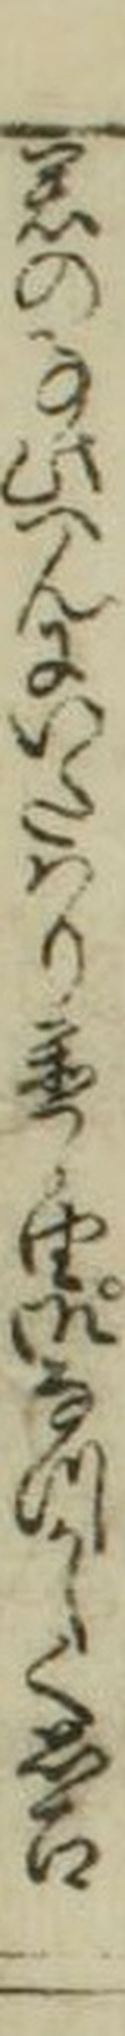君の事此へんにいたはり置し由。御なつかしく思召
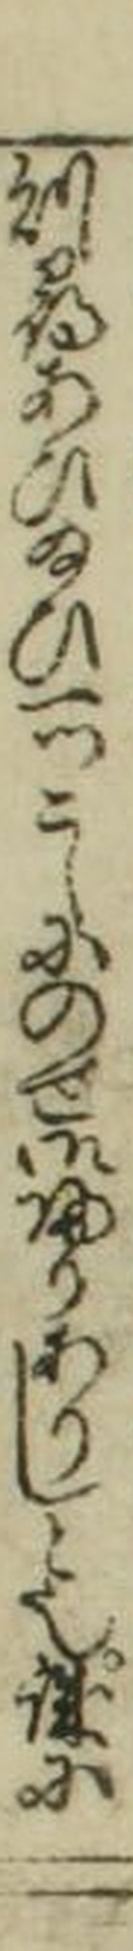則尋あひ給ひ一ツこしにのせ御帰りありしと也。誠に
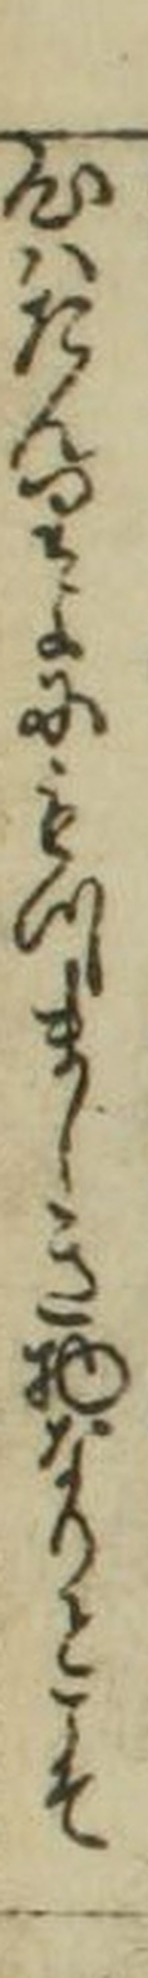心はたんりよにもつましき物なりとこそ

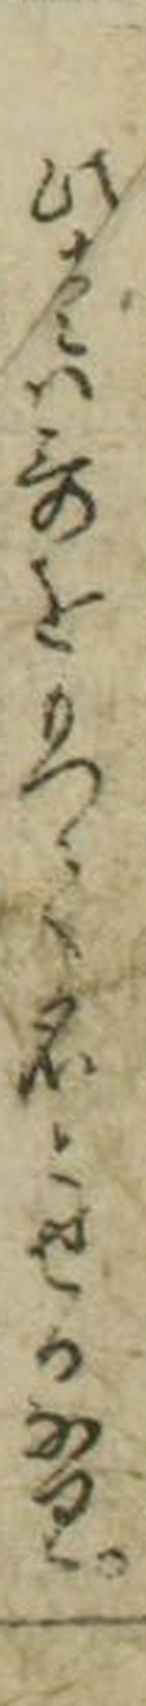此巻は哥をもつて名とせるなり。
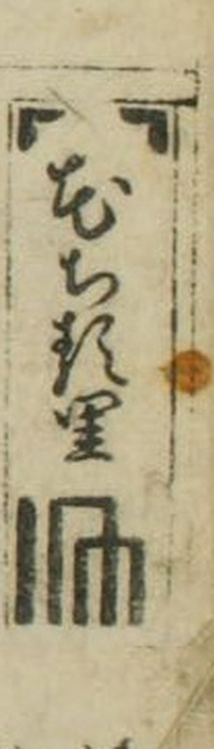「花ちる里
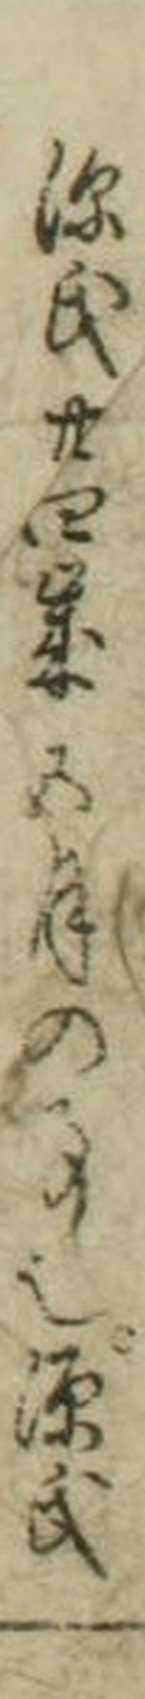源氏廿四歳五月の事也。源氏
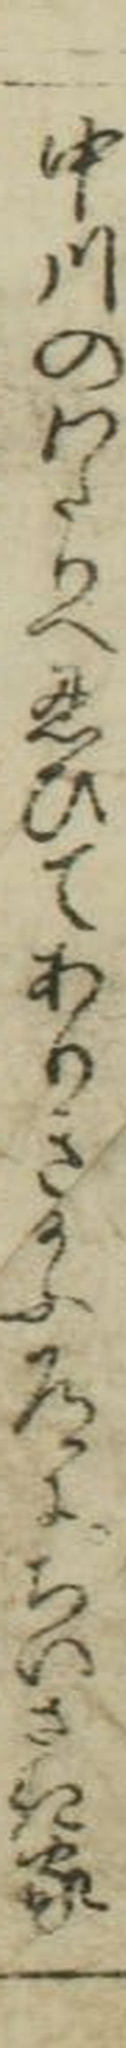中川のわたりへ忍ひてありき給ふ道に。ちいさき家
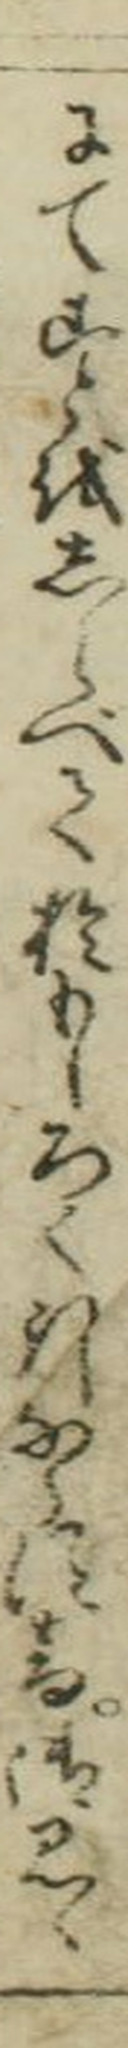にてことをしらべておもしろく引ならす音。みゝ
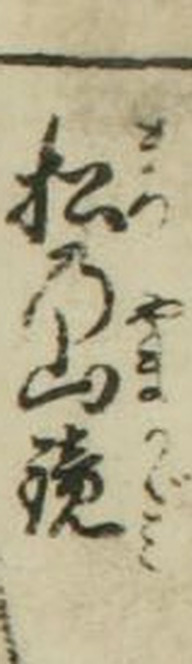松の山鏡
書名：女源氏教訓鑑
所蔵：東京学芸大学附属図書館
